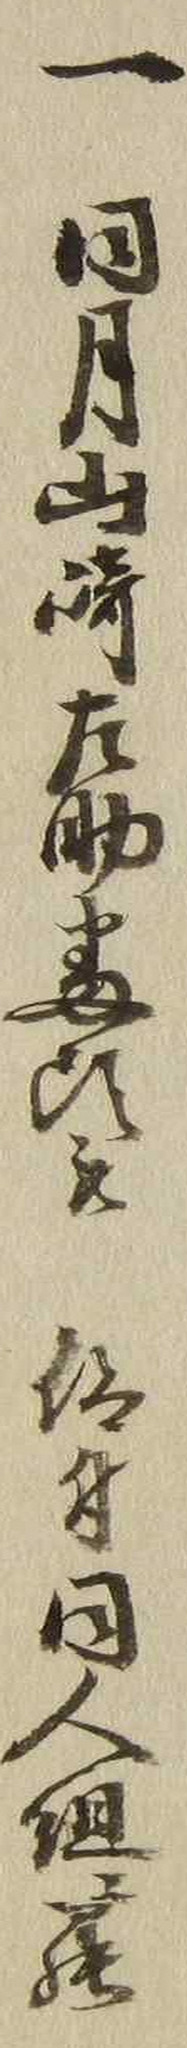一同月山崎左助番頭被仰付同人組ニ罷
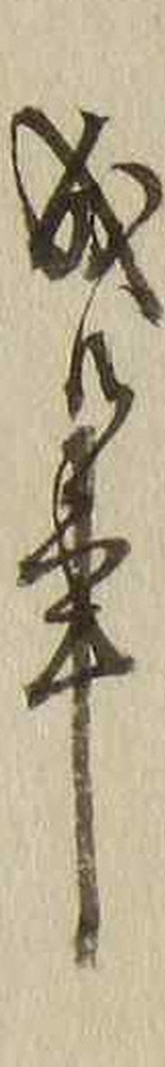成候事
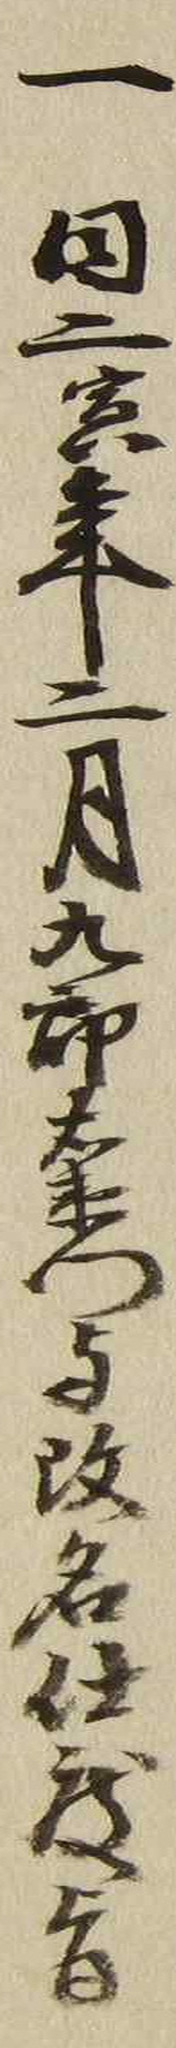一同二寅年二月九郎右衛門与改名仕度旨
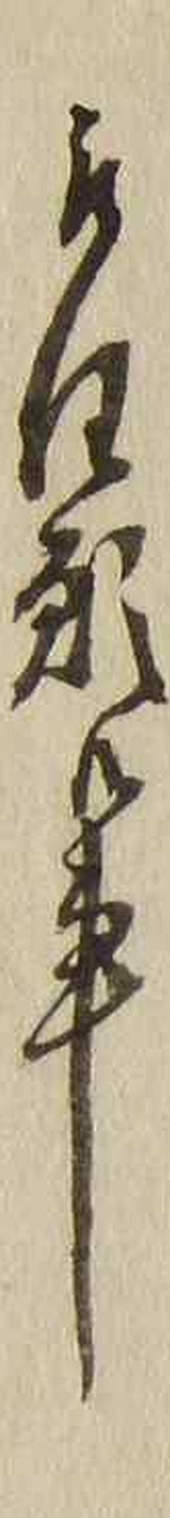被任願候事

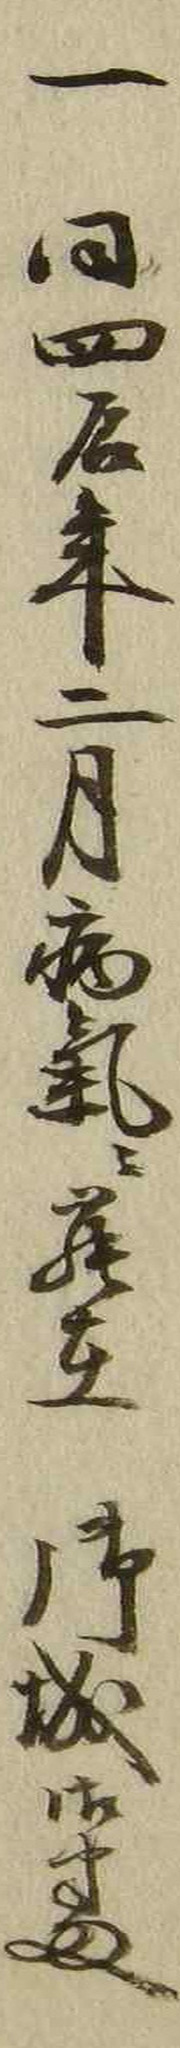一同四辰年二月病気ニ罷在御城御番
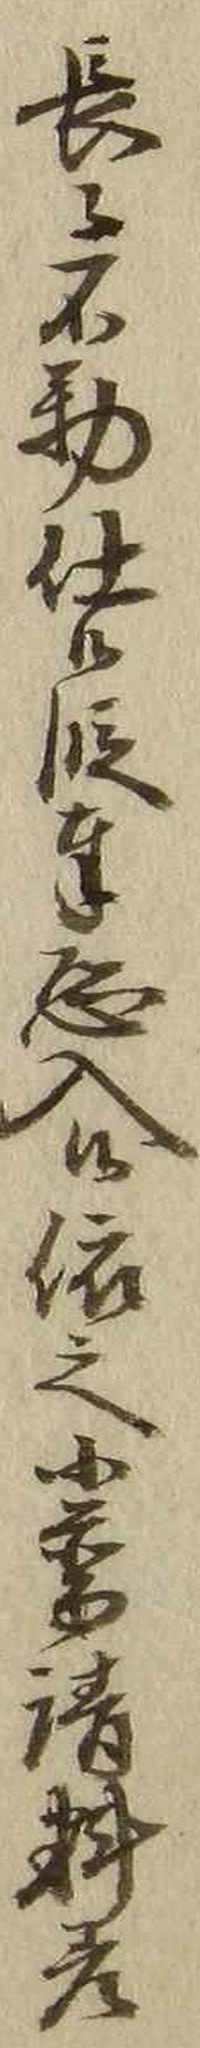長子不勤仕候段奉恐入候依之小普請料差
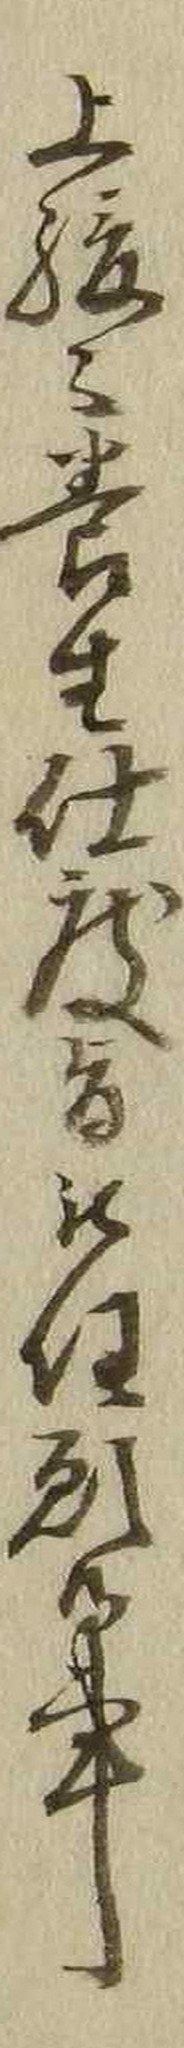上緩々養生仕度旨被任願候事
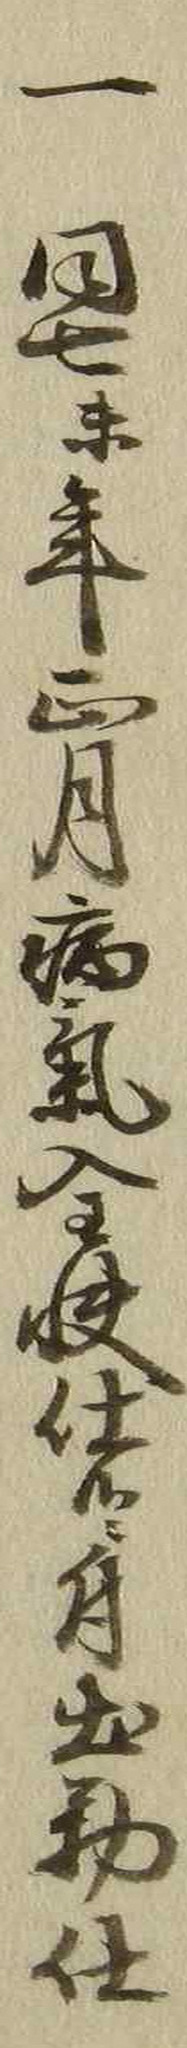一同七未年正月病気全快仕候ニ付出勤仕
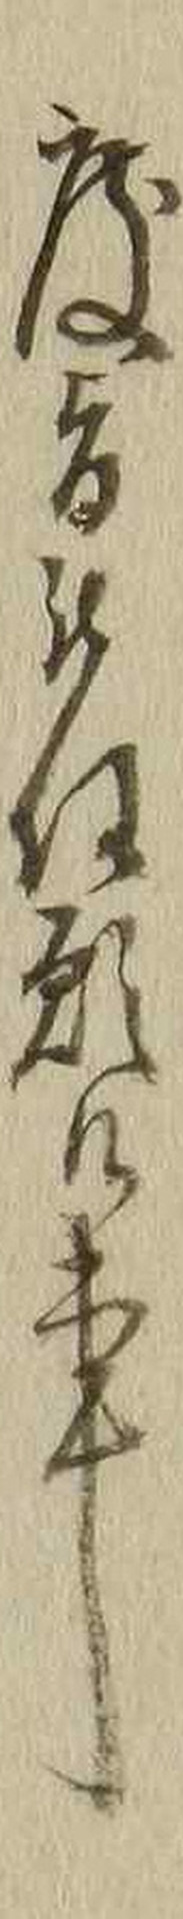度旨被任願候事
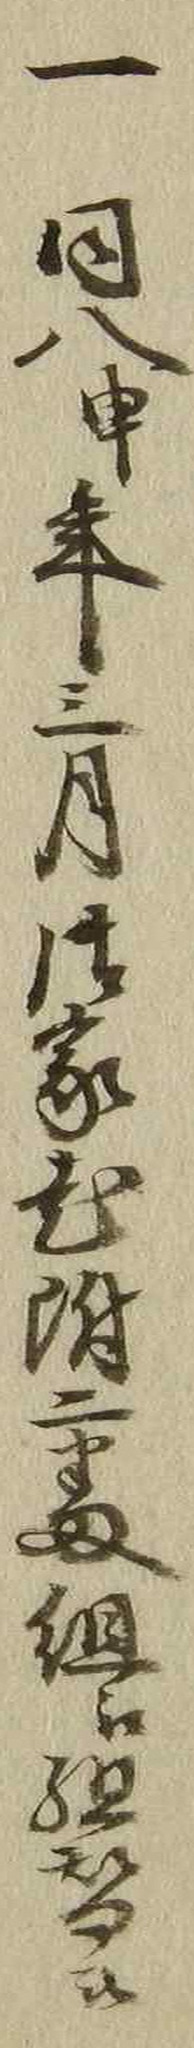一同八申年三月御家老附二番組江組替被
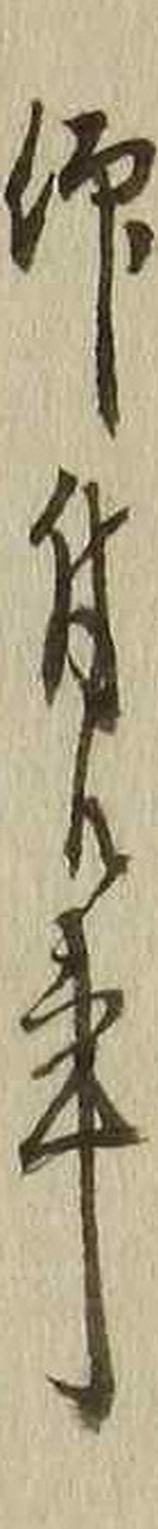仰付候事
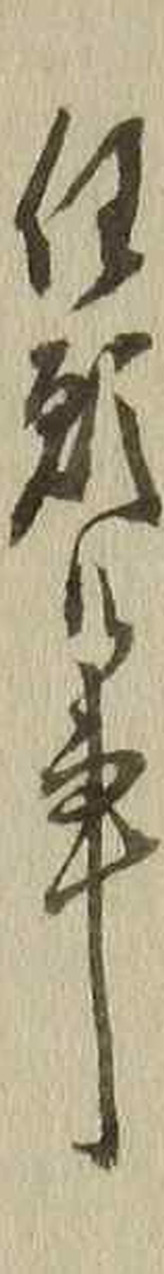任願候事
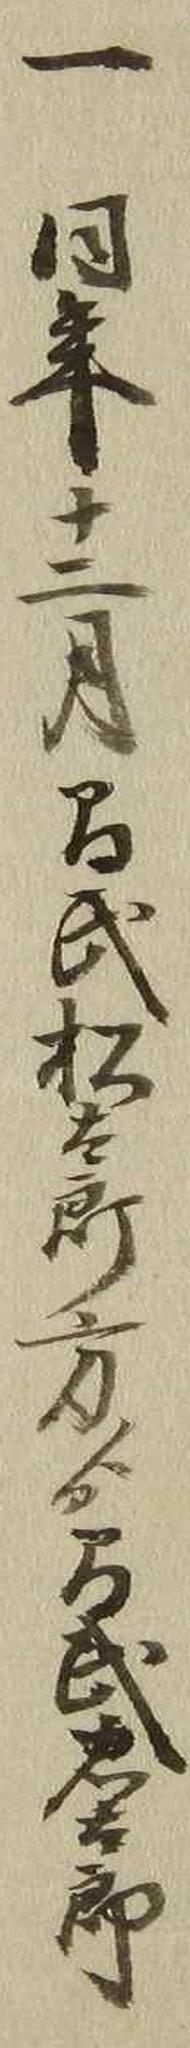一同年十二月間武松太郎方ゟ間武君太郎
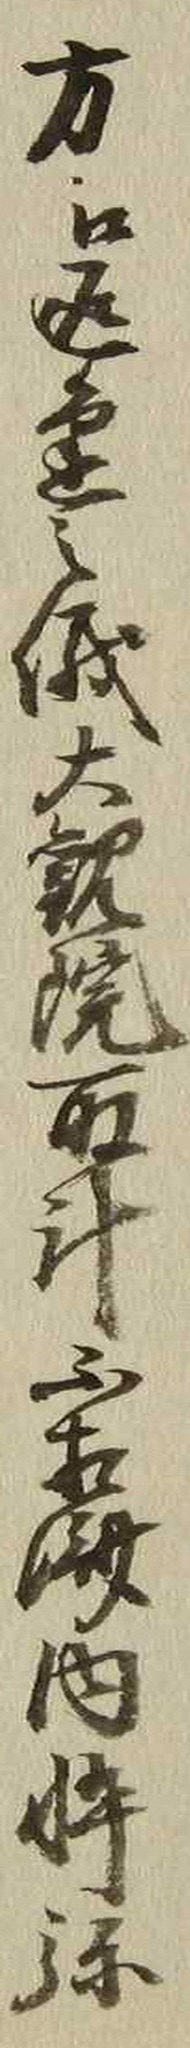方江返金之儀大管院大観院取計不相済内忰弥
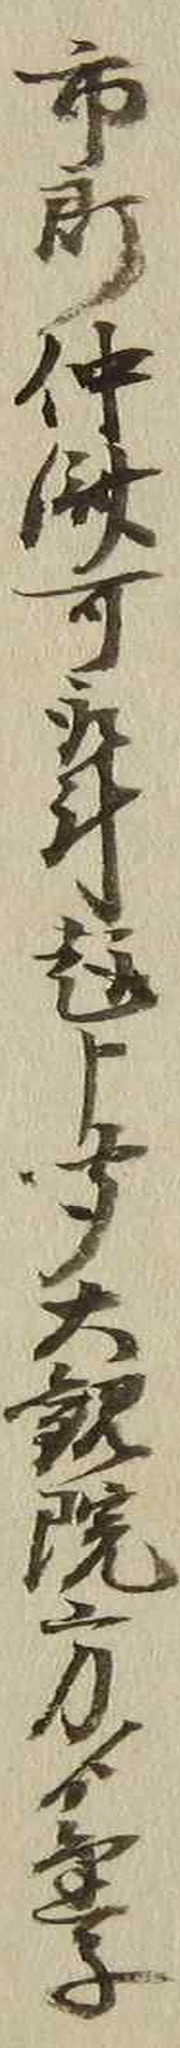市郎仲済可取計趣申聞大観院方ゟ金子
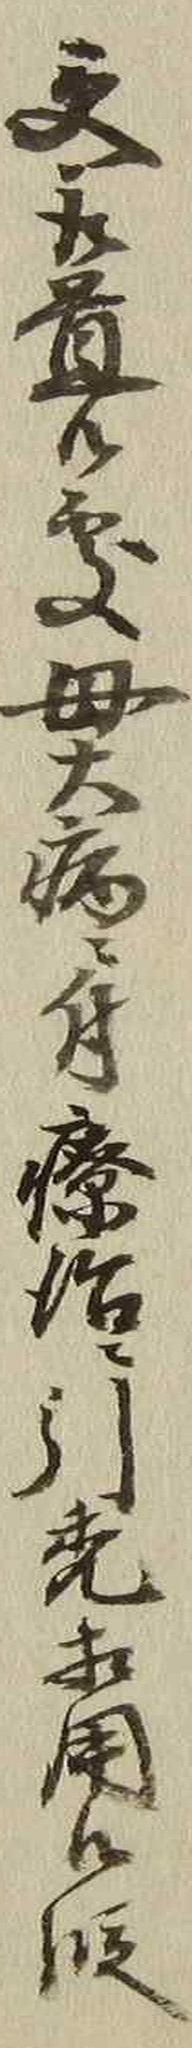更取置候處母大病ニ付療治ニ引禿相用候段
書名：諸士系譜　巻之64　と之部7
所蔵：会津若松市立会津図書館
